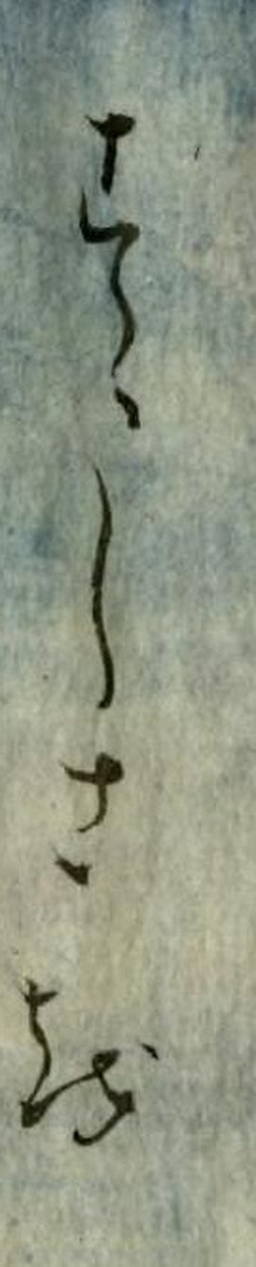すゝしさを
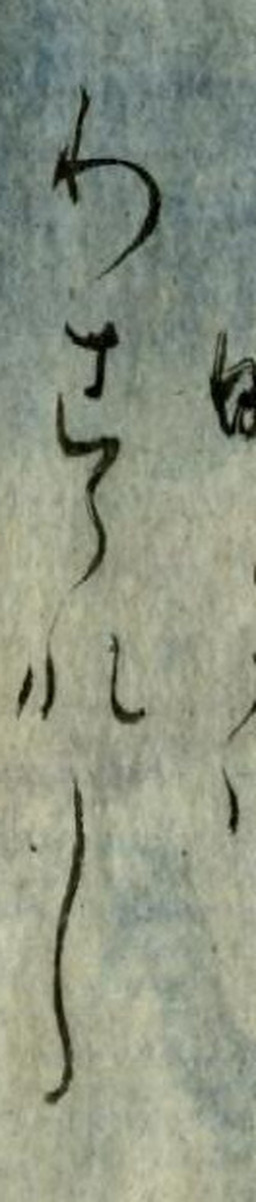わすれし
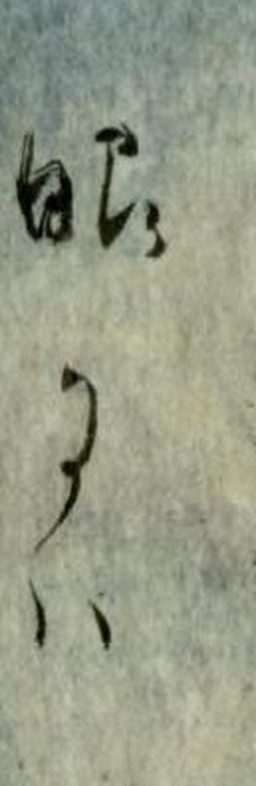眼には
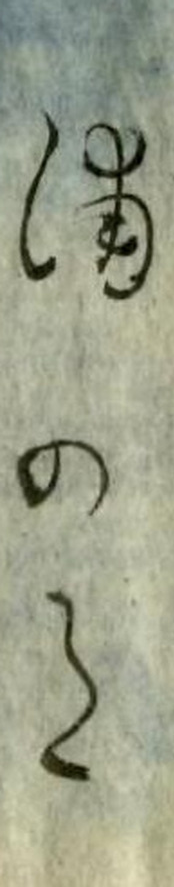浦の月

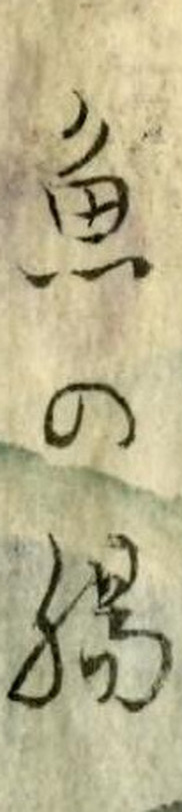魚の腸

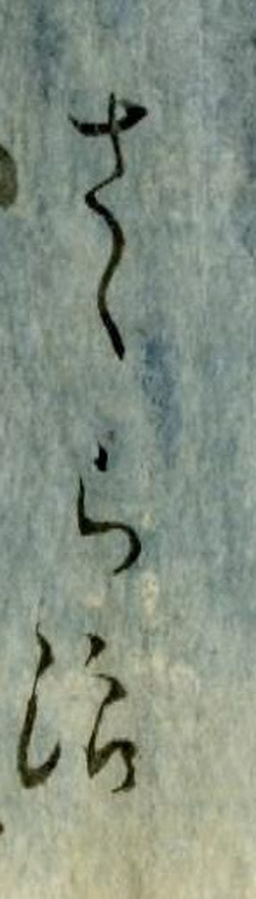さゝら浪
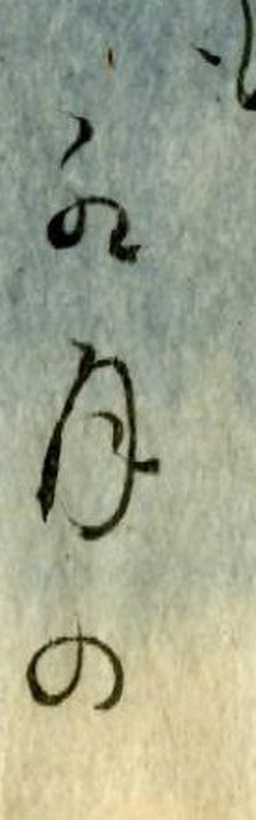卯月の

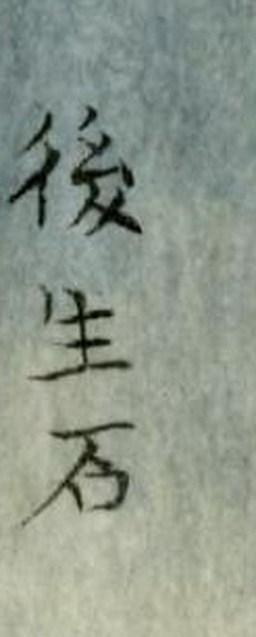後生石
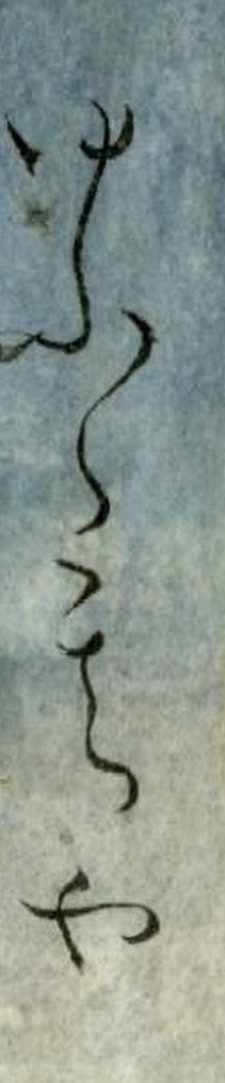ゆふたちや
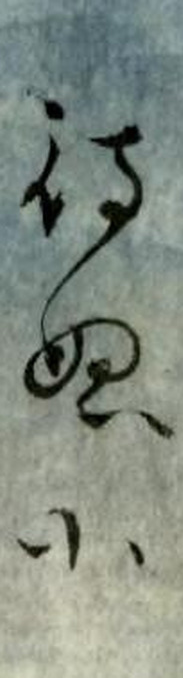待ぬに
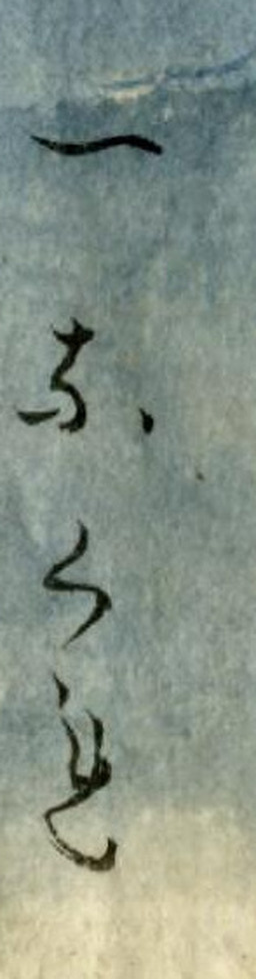一なくれ
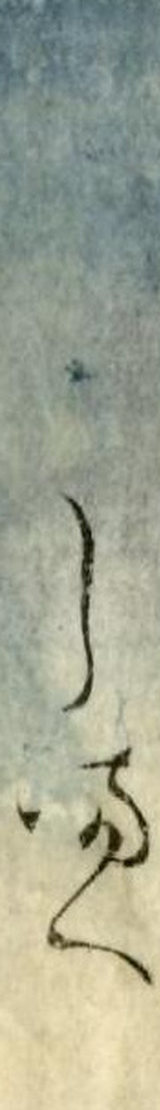しまへ
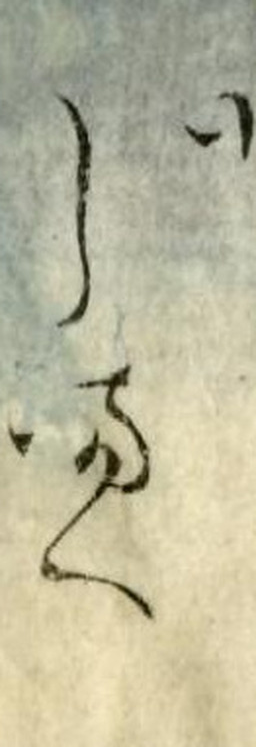しまへ

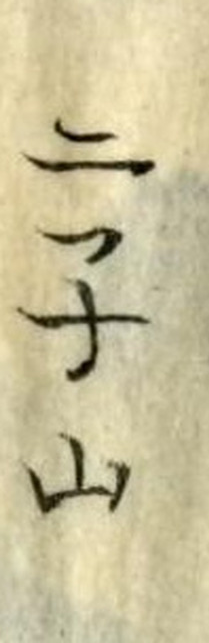二子山
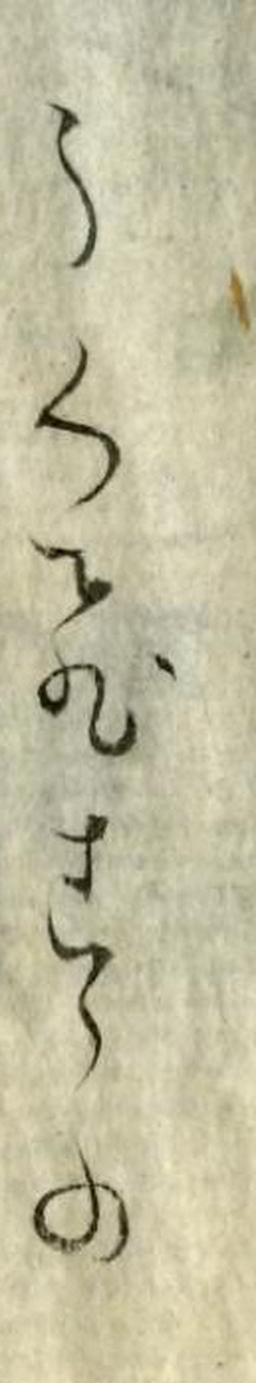うくひすの
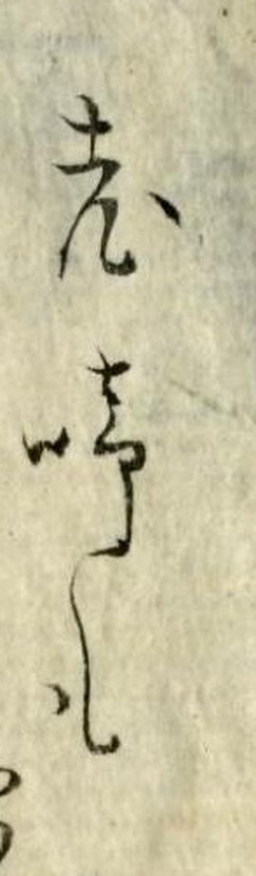老啼も
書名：能登めぐり
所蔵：Ishikawa Prefectural Library
